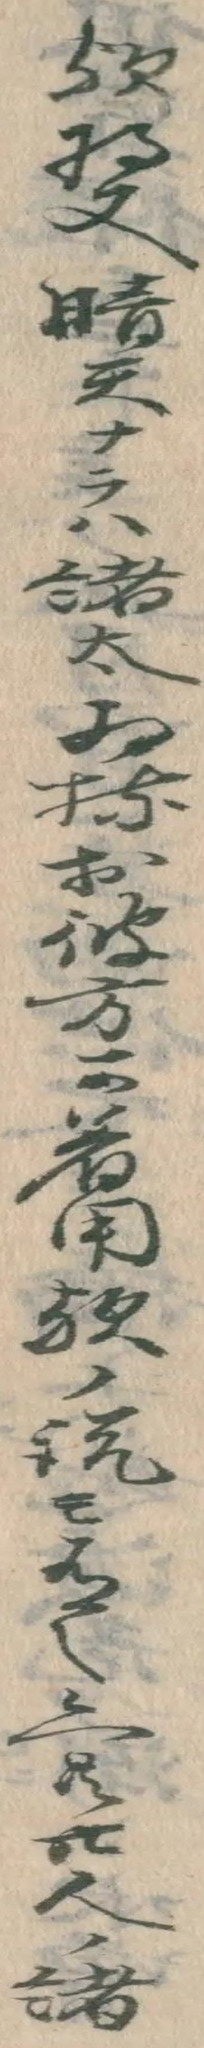歟将又晴天ナラハ諸太為持於彼方可着用歟ノ説モ有之候へ共廿人ノ諸
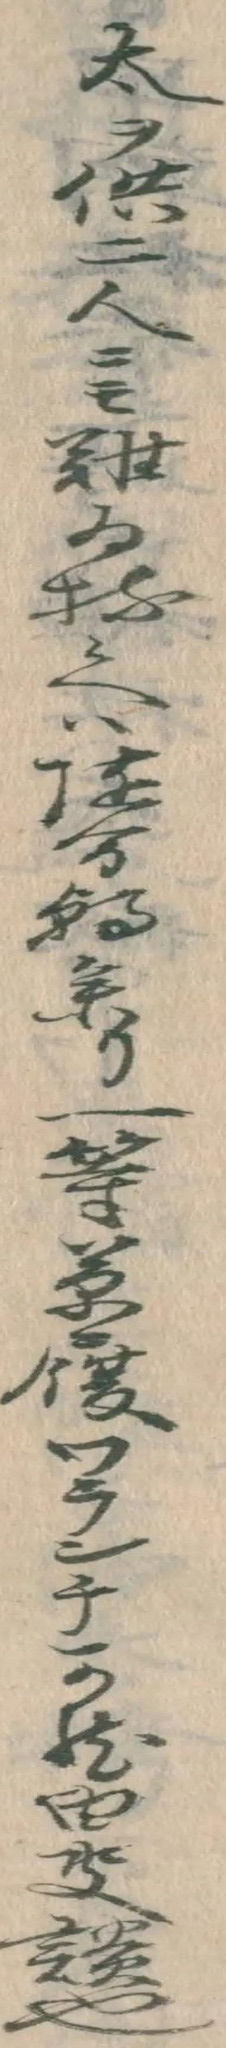太ヲ供二人ニモ難為持候ヘハ随分朝参リ一等草履ワランチ可然由決談也
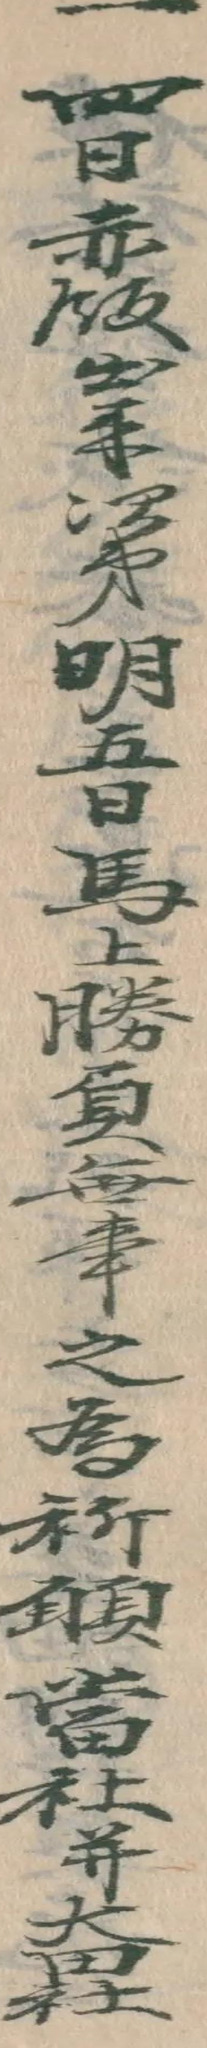一四日赤飯出来次第明五日馬上勝負無事之為祈願当社并大田社
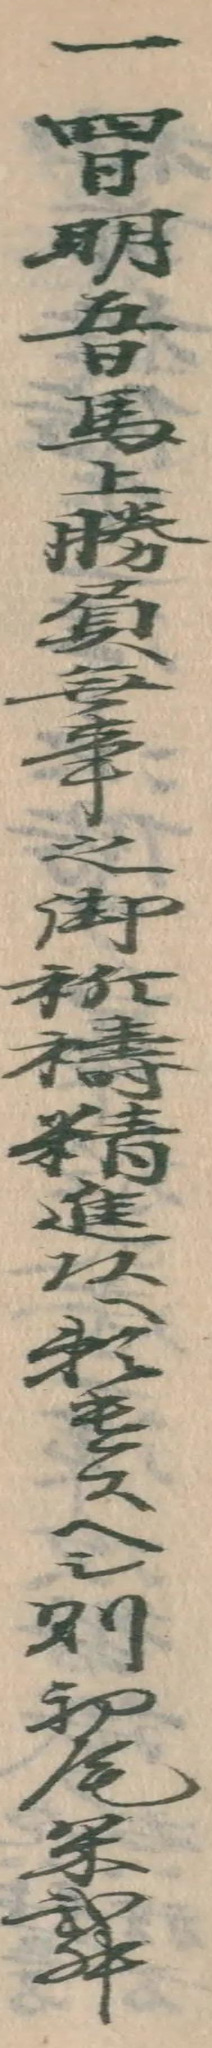一四日明五日馬上勝負無事之御祈祷精進頭へ頼遣スヘシ別初尾米弐升
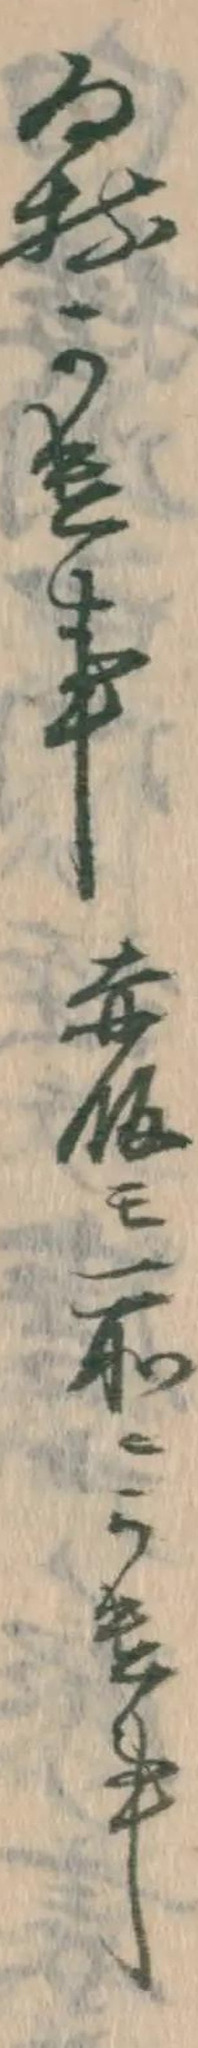為持可遣事赤飯モ一所二被遣事
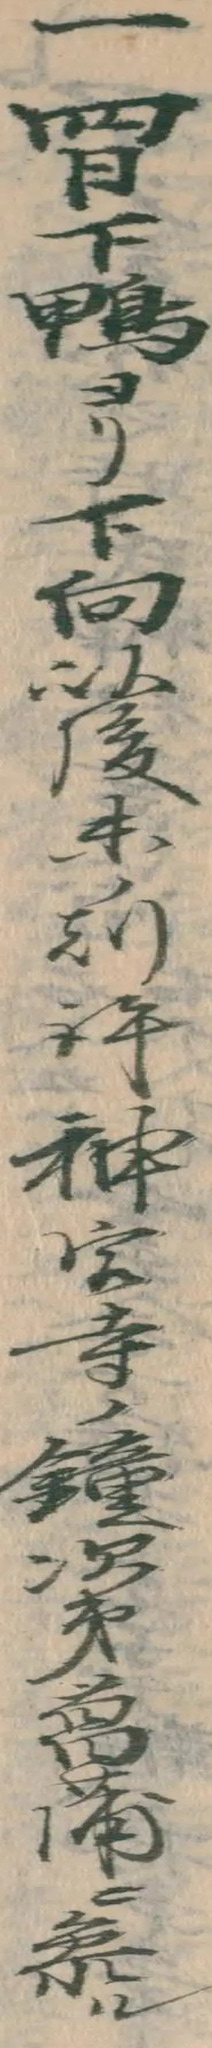一四日下鴨ヨリ下向以後未ノ刻許神宮寺ノ鐘次第菖蒲ニ参ル
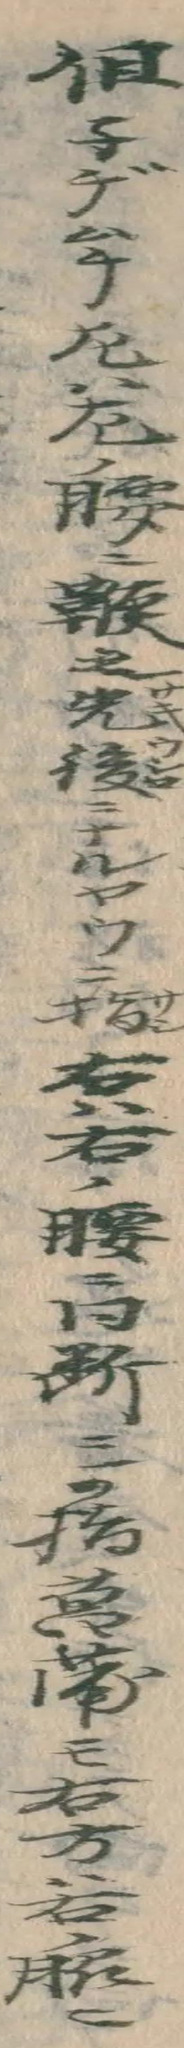但ネヂムチ左ハ左ノ腰ニ鞭之先後ニナルヤウニ指右ハ右ノ腰ニ同断ニ可指菖蒲モ右方ハ右ノ脇ニ
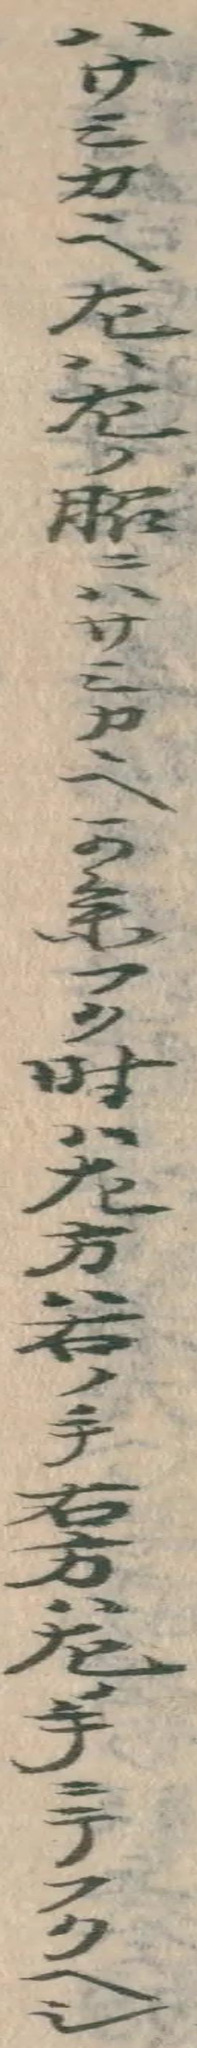ハサミカヽへ左ハ左ノ脇ニハサミカヽヘ可参フク時ハ左方ハ右ノ手右方ハ左ノ手ニテフクヘシ
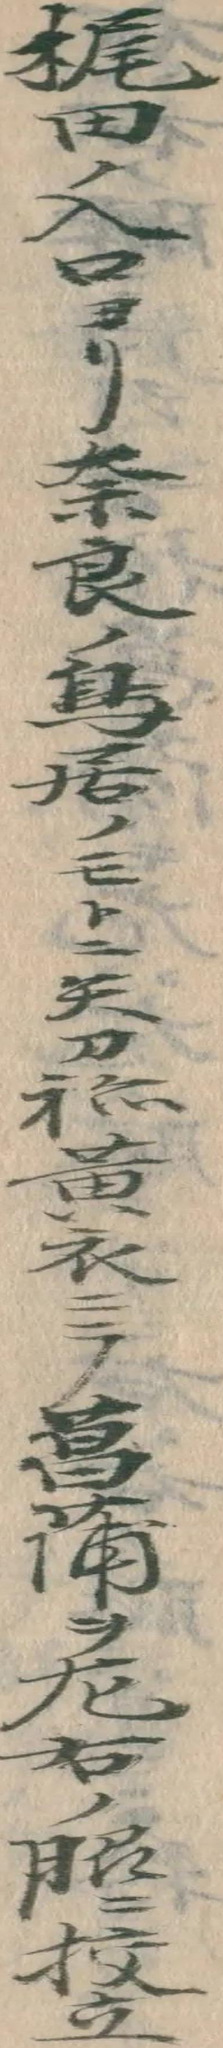梶田ノ入口ヨリ奈良ノ鳥居ノモトニ矢刀禰黄衣ニテ菖蒲ヲ左右ノ脇ニ校立
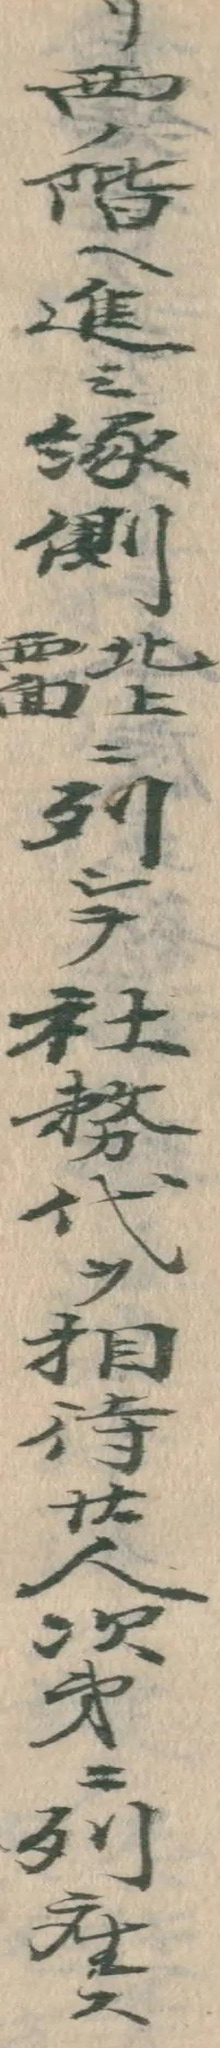リ西ノ階ヘ進ミ縁側北上西面ニ列シテ社務代ヲ相待廿人次第ニ列座ス
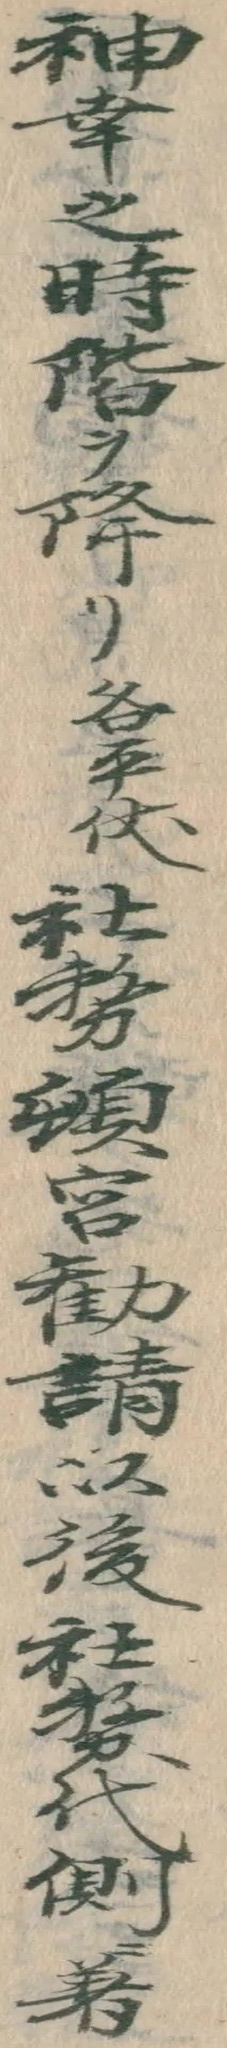神幸之時階ヲ降リ各平伏社務頓宮勧請以後社務代側ニ着
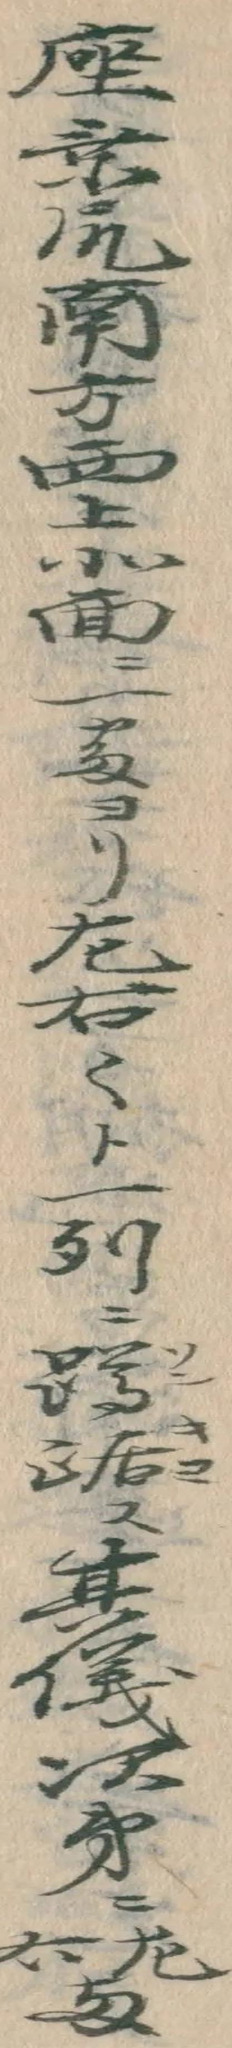座乗尻南方西上北面ニ一番ヨリ左右〱ト一列ニ蹲踞ス其儀次第ニ左右両

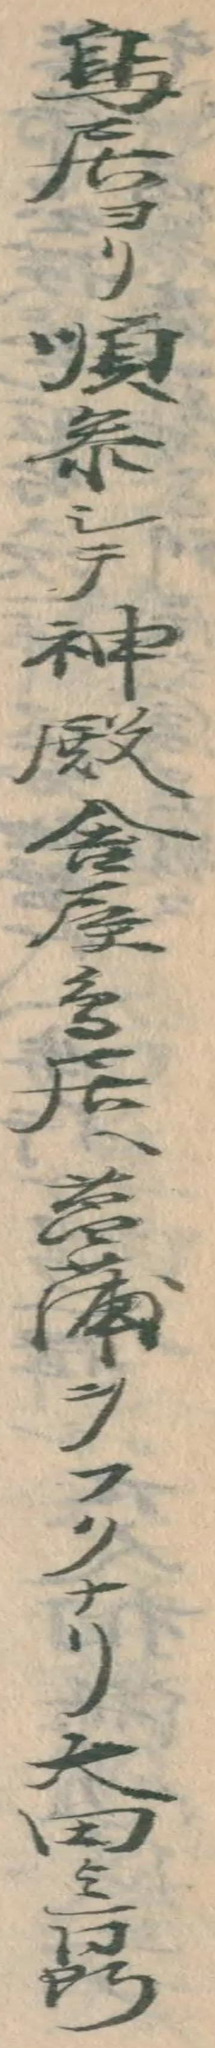鳥居ヨリ順参シテ神殿舎屋鳥居へ菖蒲ヲフクナリ大田迄同断
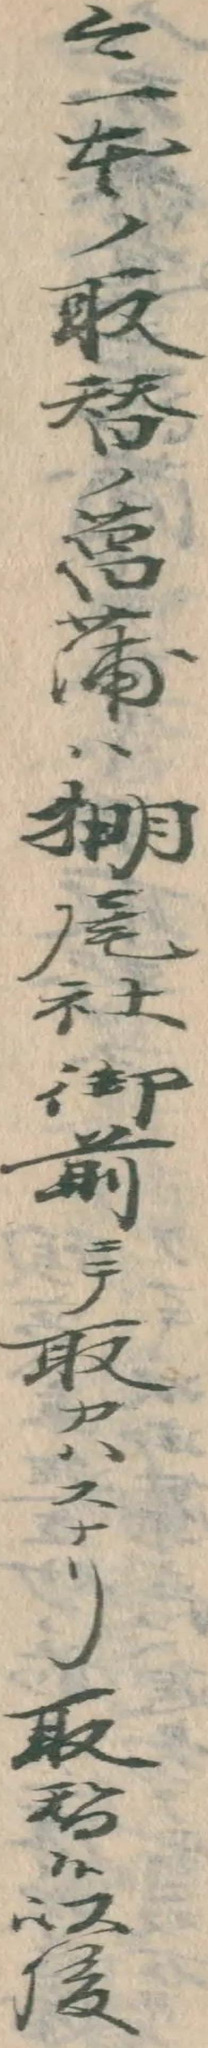今一本ノ取替ノ菖蒲ハ棚尾社御前ニテ取カハスナリ取替候以後
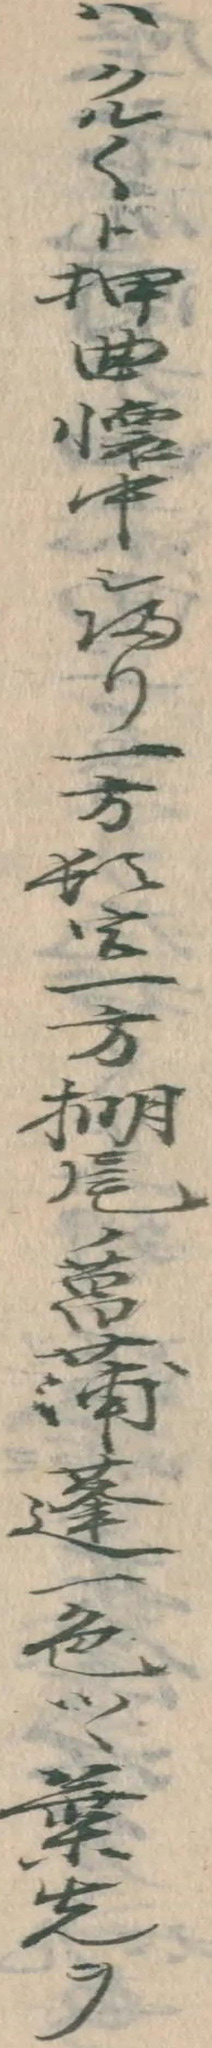ハクル〳〵ト押曲懐中シ帰リ一方頓宮一方棚尾ノ菖蒲蓬一色ツヽ葉先ヲ
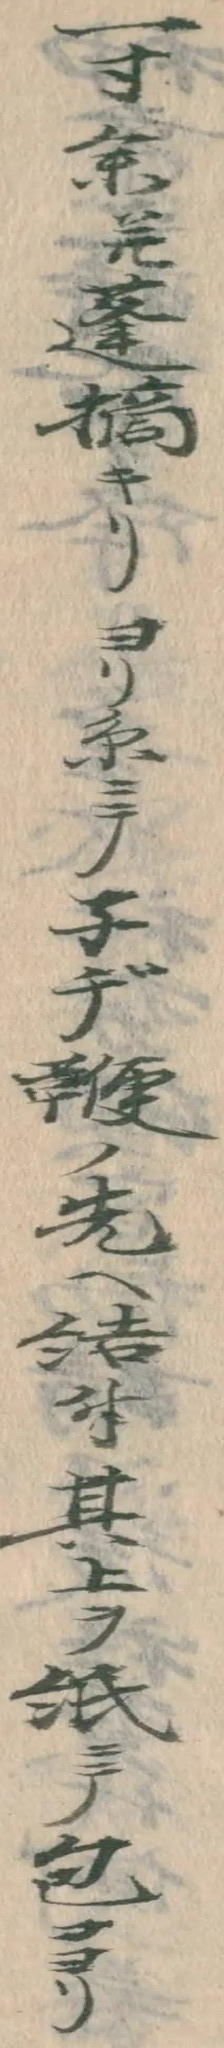一寸余并蓬摘キリヨリ糸ニテネヂ鞭ノ先へ結付其上ヲ紙ニテ包コヨリ
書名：賀茂社記録. 第11冊
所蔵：国立国会図書館 National Diet Library, JAPAN
